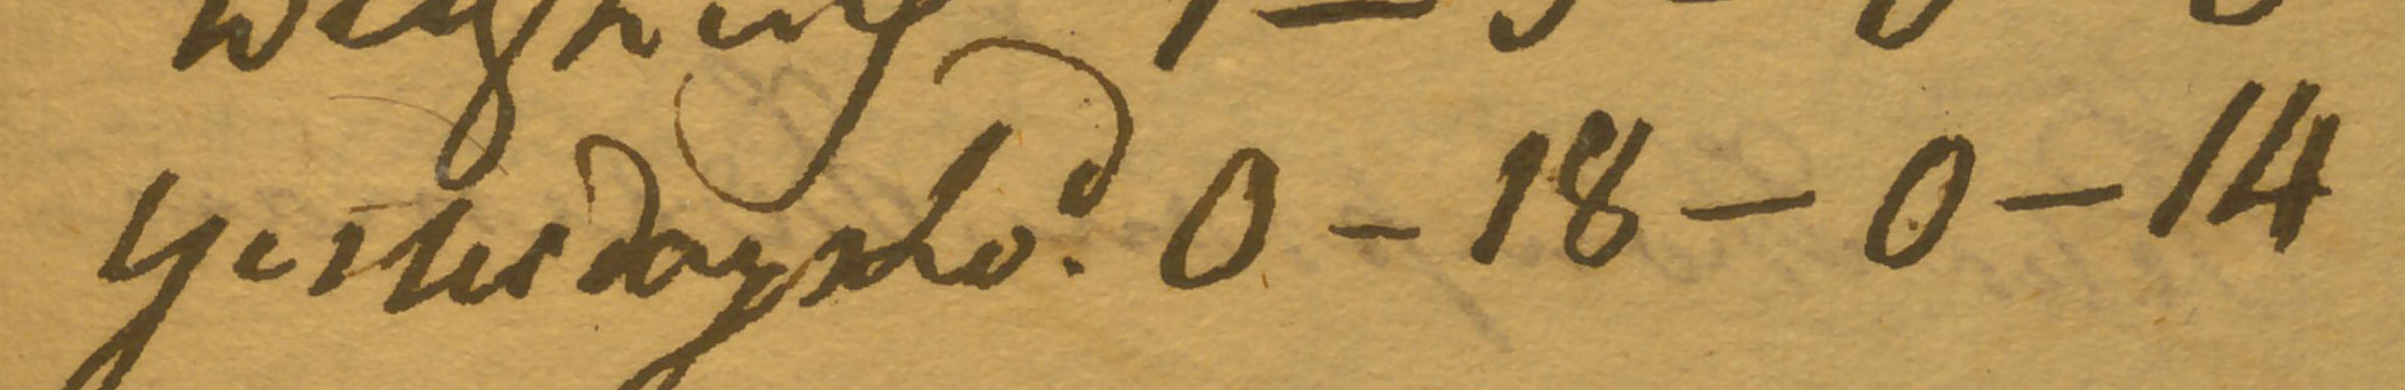Yesterday Lo^d. 0-18-0-14
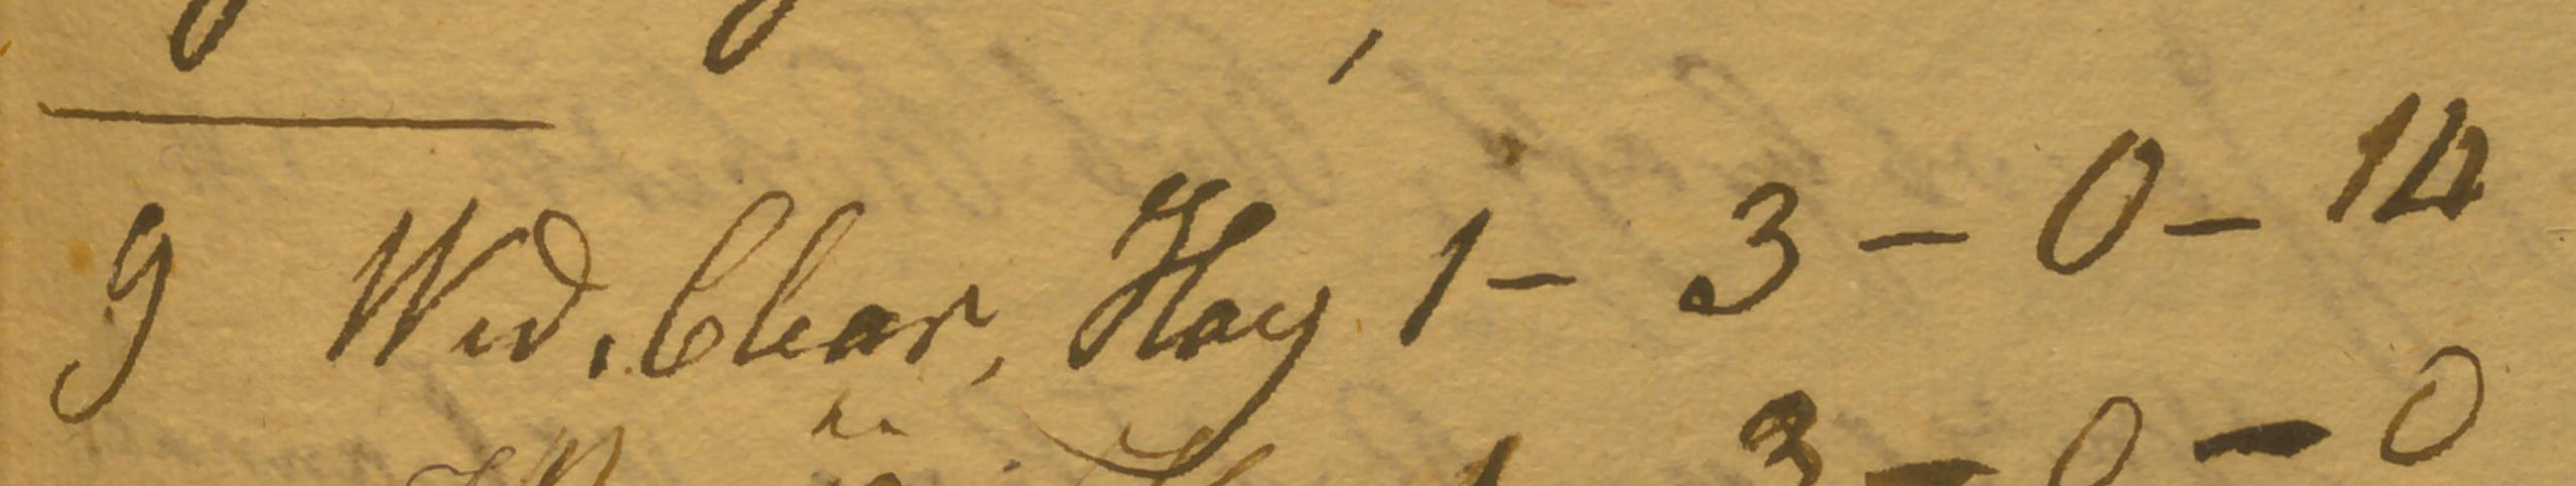9 Wed. Clear Hay 1-3-0-14
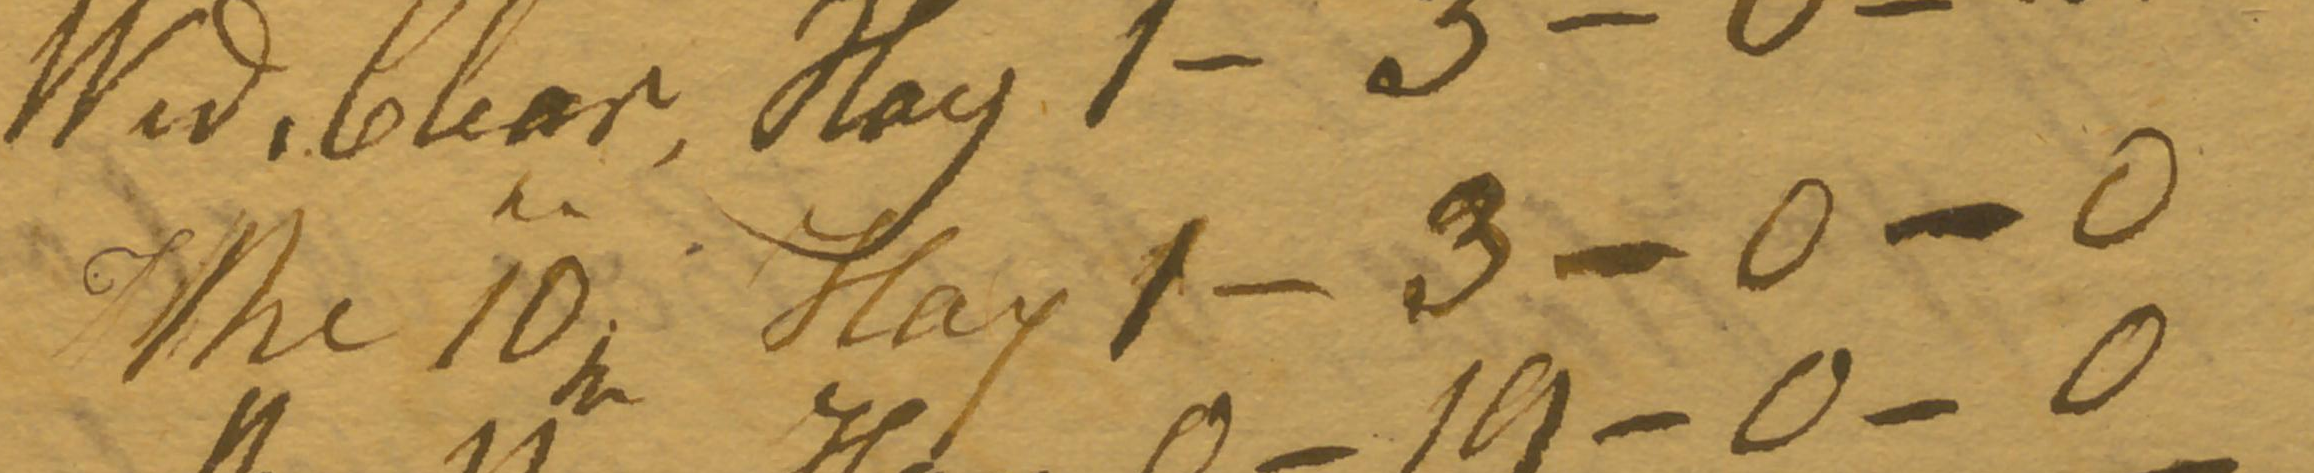The 10^h Hay 1-3-0-0
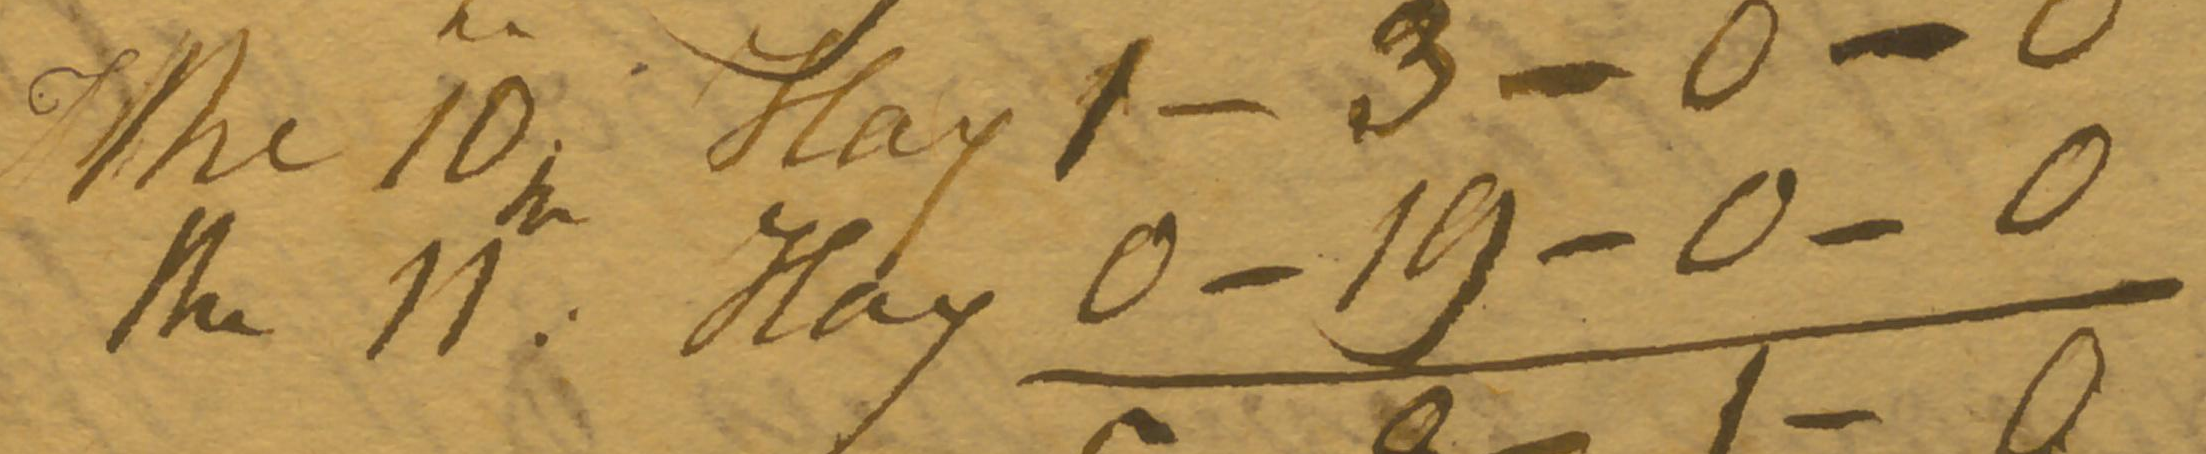the 11^th. Hay 0- 9-0-0
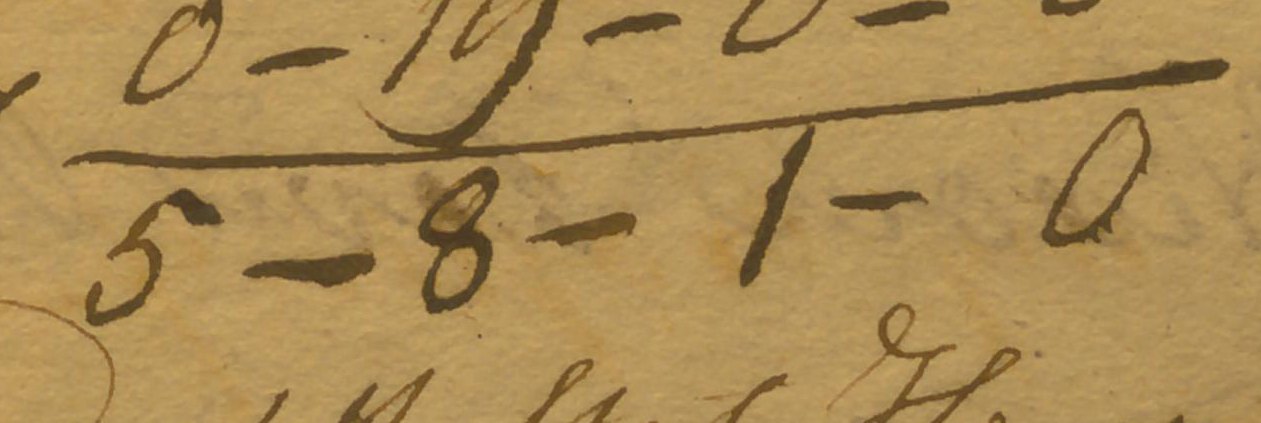5-8-1-0
